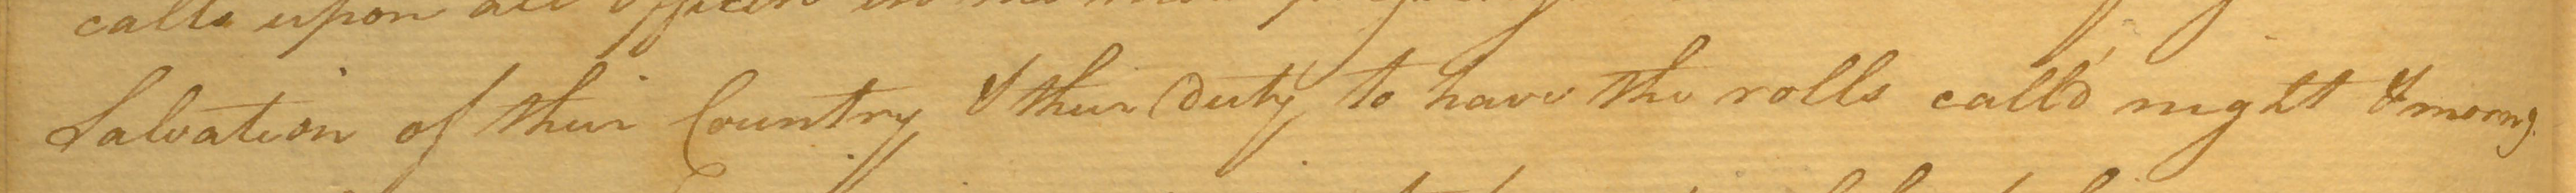Salvation of their Country & their duty to have the rolls call'd night & morng
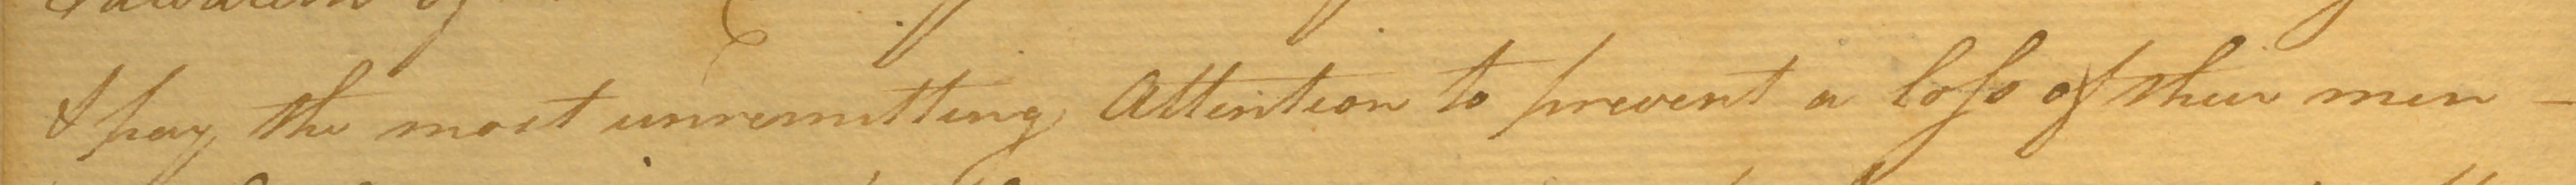& pay the most unremitting Attention to prevent a loss of their men-
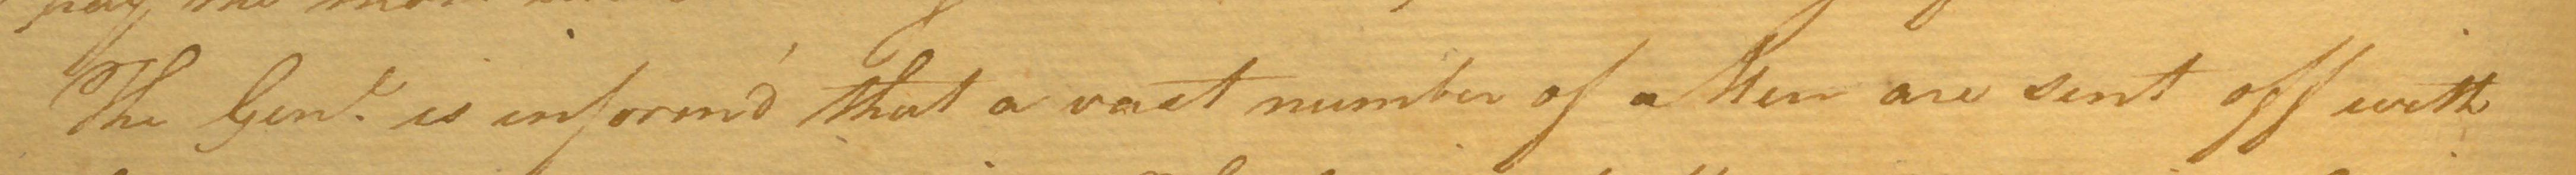The Gen^l. is inform'd that a vast number of men are sent off with
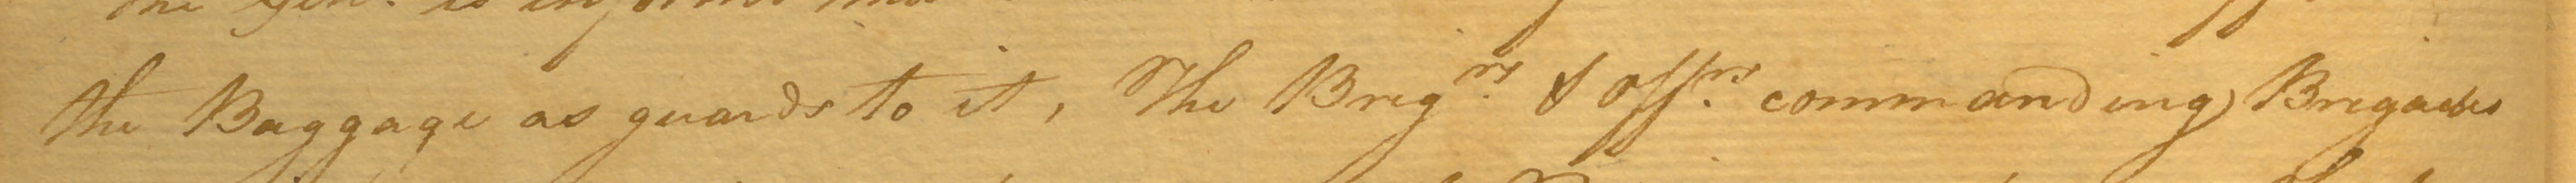the Baggage as guards to it, The Brig^rs. & Off^rs. commanding Brigades
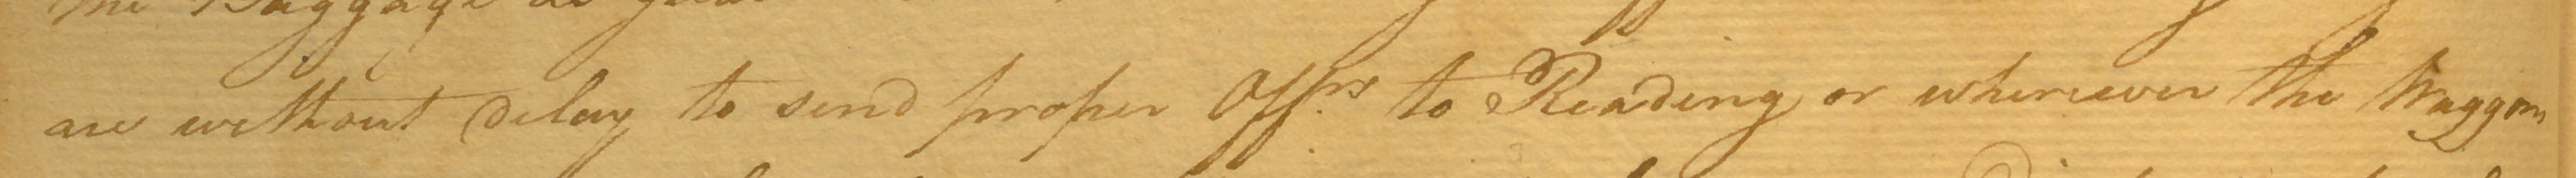are without delay to send proper Off^rs.to Reading or wherever the Waggon
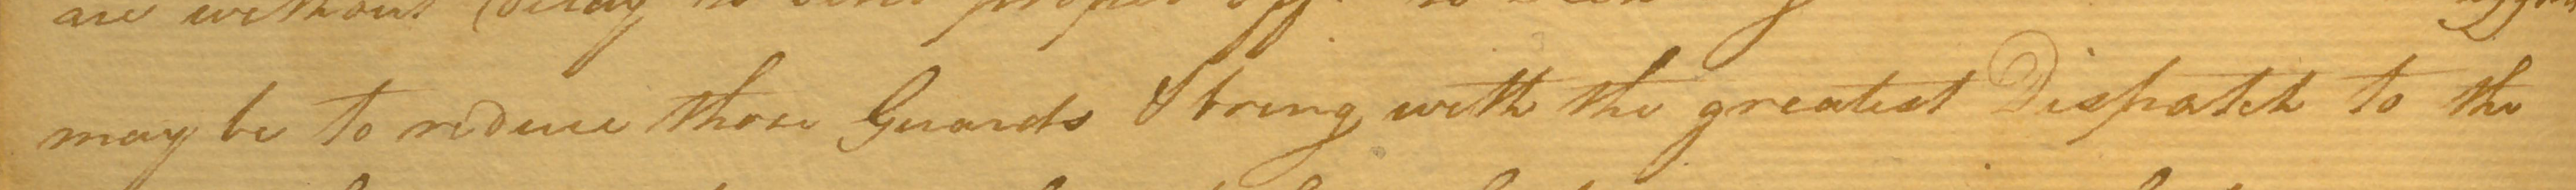may be to reduce those Guards & bring with the greatest Dispatch to the
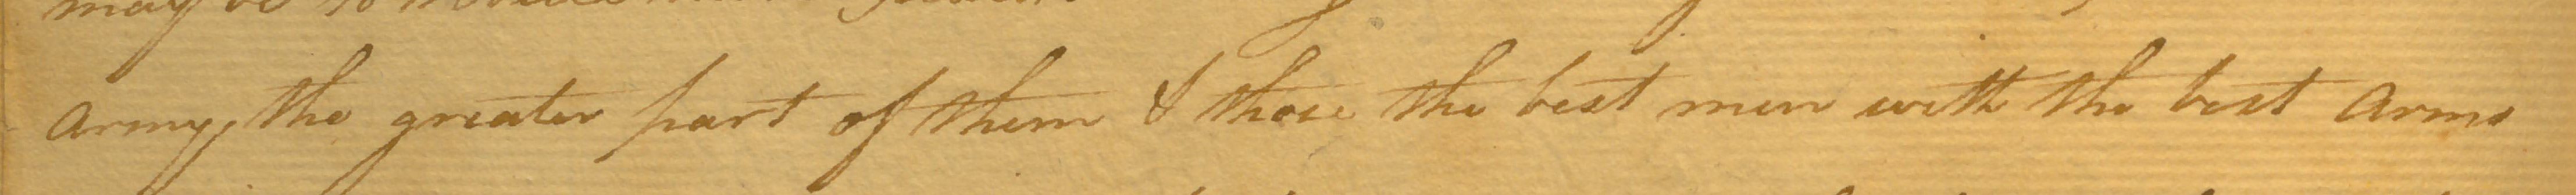Army the greater part of them & those the best men with the best Arms
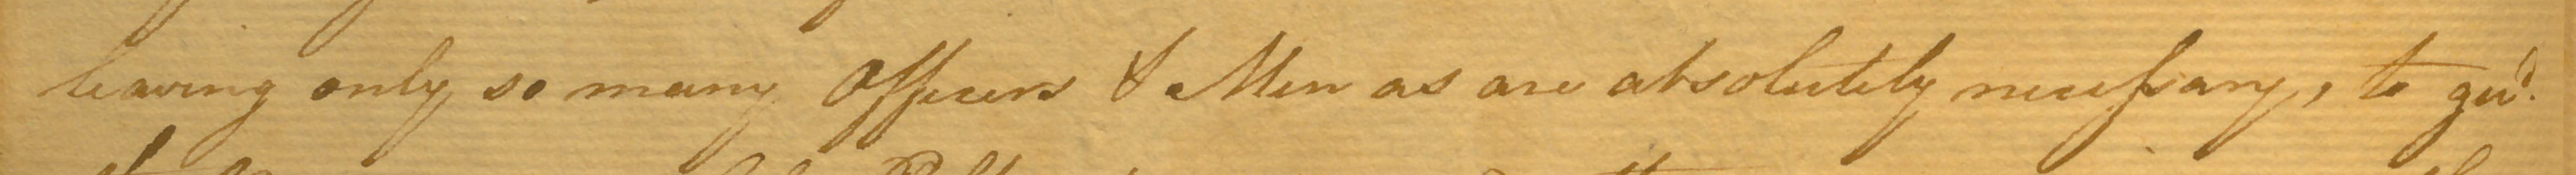leaving only so many Officers & Men as are absolutely necessary, to gu^d.
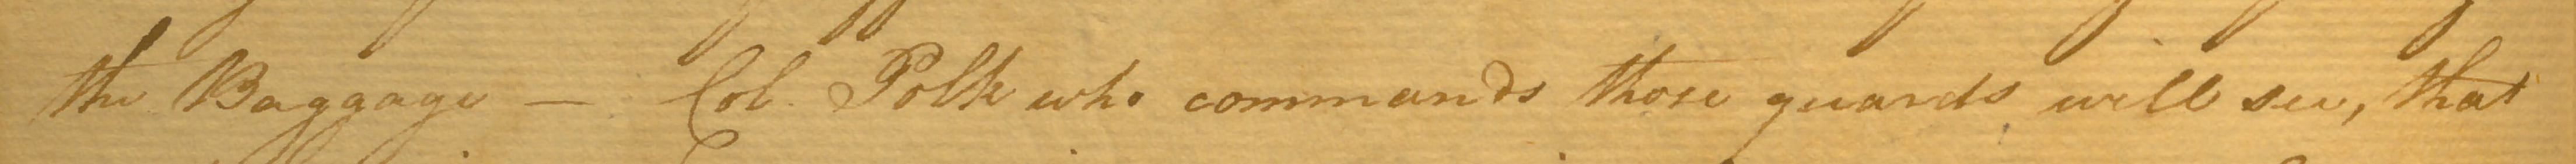the Baggage- Col. Polk who commands those guards will see, that
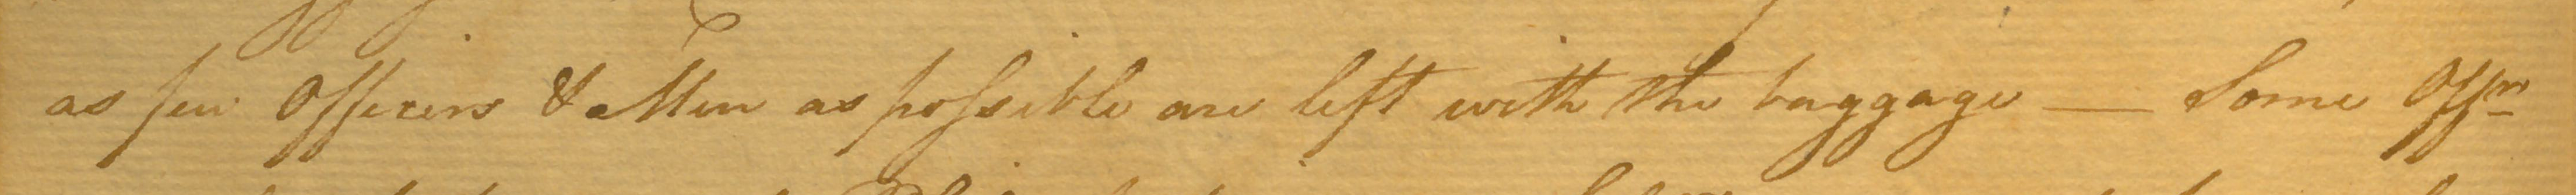as few Officers & Men as possible are left with the baggage- Some Off^rs
